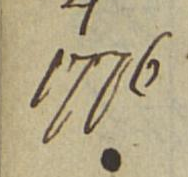1776
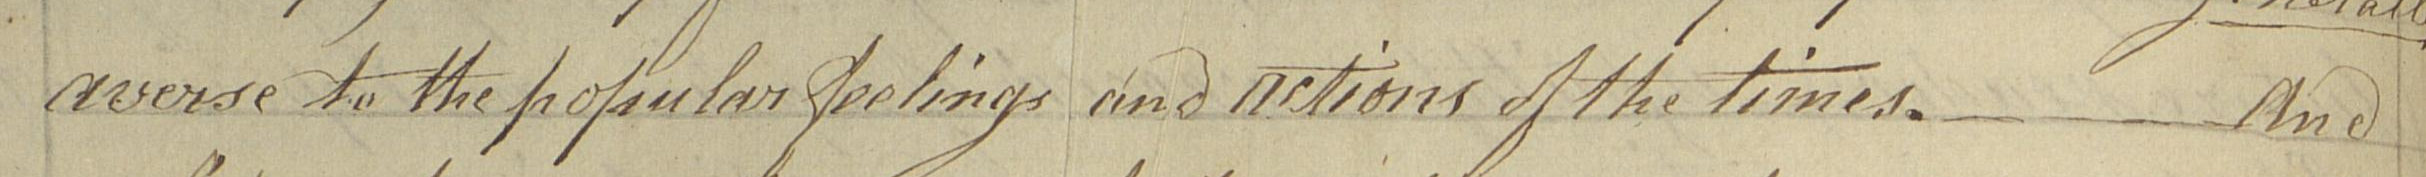averse to the popular feelings and Actions of the times. And
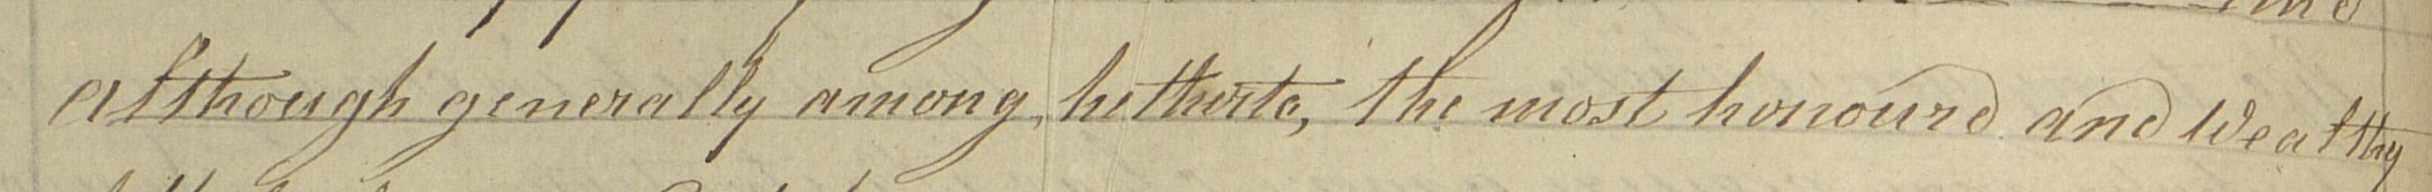although generally among be hitherto, the most honourd and Wealthy
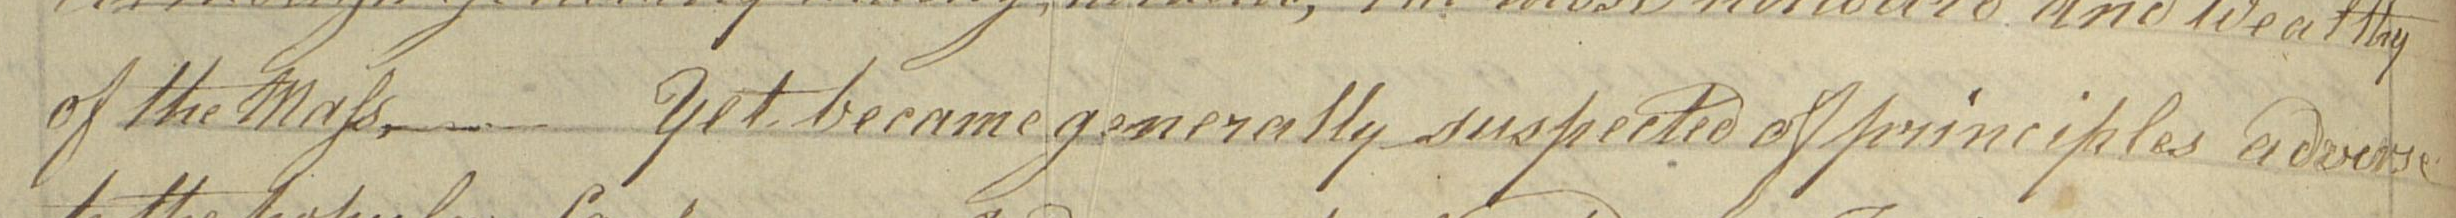of the Mass, Yet became generally suspected of principles adverse
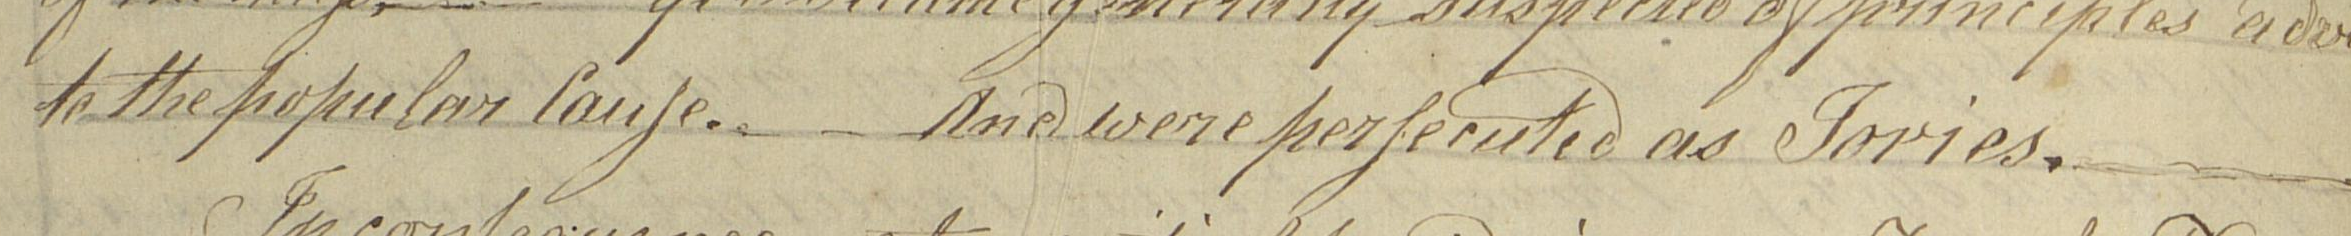to the popular Cause. And were persecuted as Tories.
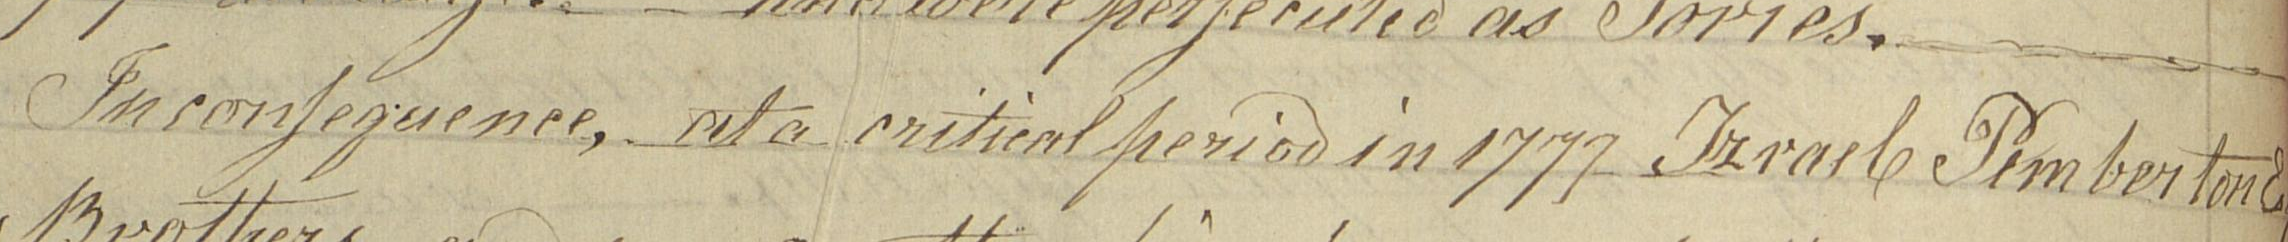In consequence, at a critical period in 1777 Israel Pemberton Esq^r
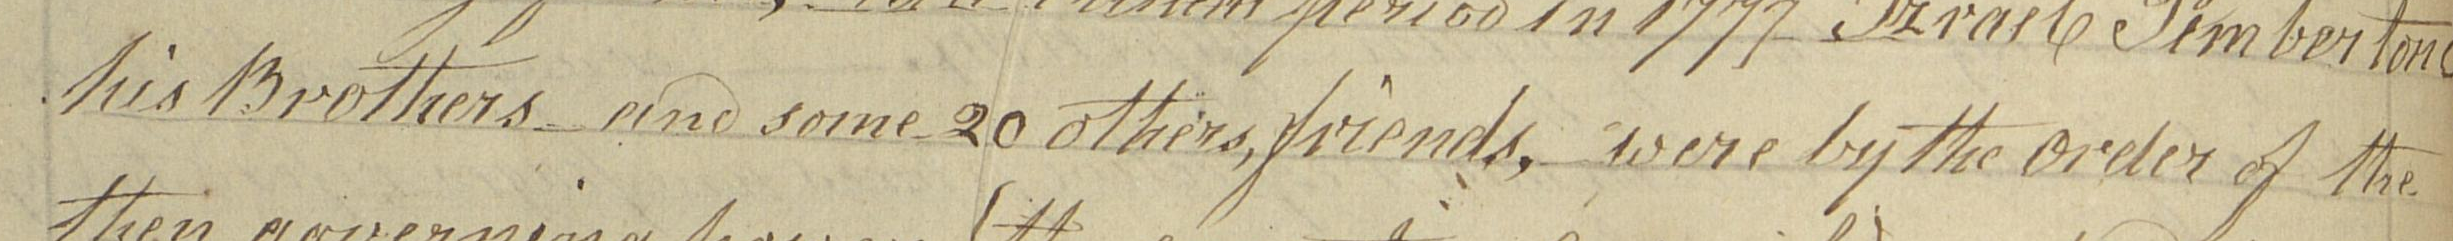his Brothers, and some 20 others, friends, were by the order of the
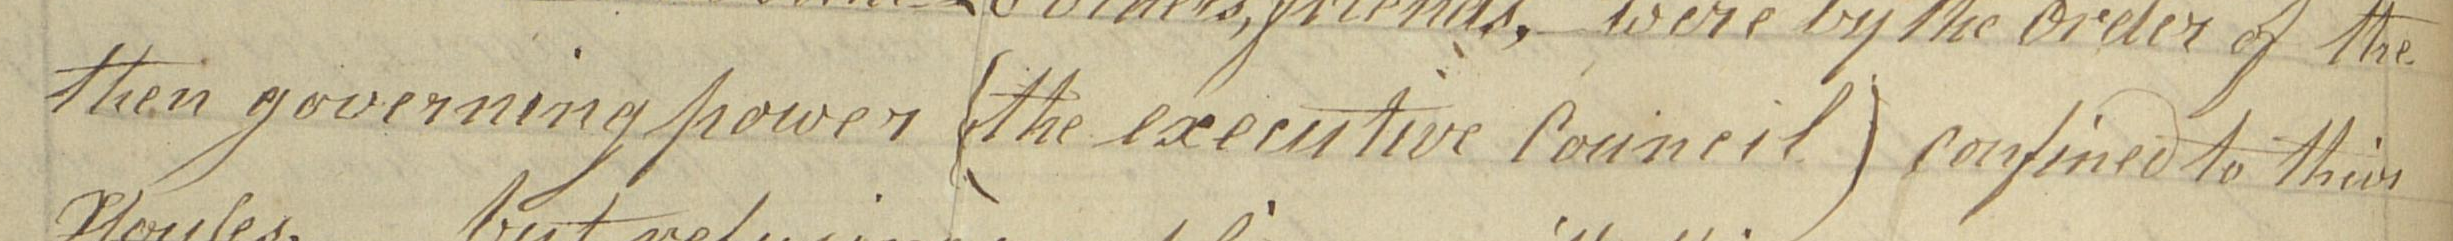then governing power (the executive council) confined to their
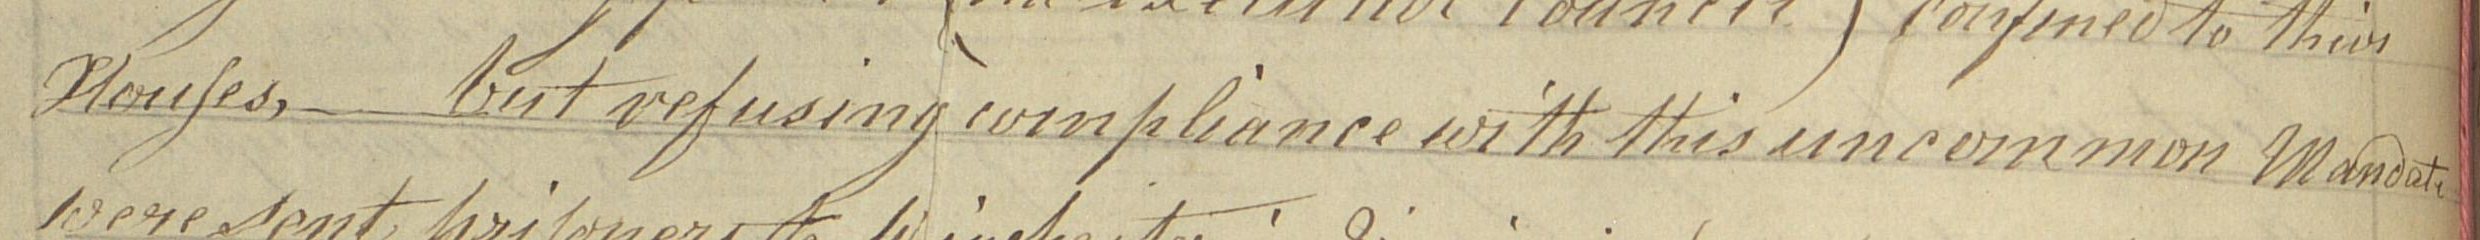Houses, but refusing compliance with this uncommon Mandate
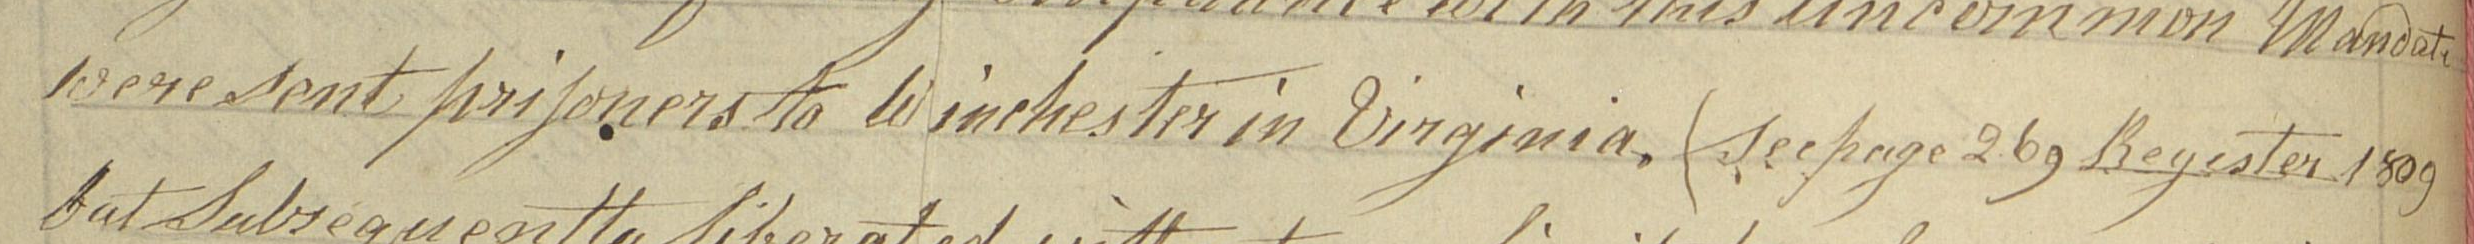were sent prisoners to Winchester in Virginia. (See page 26, Register 1809
